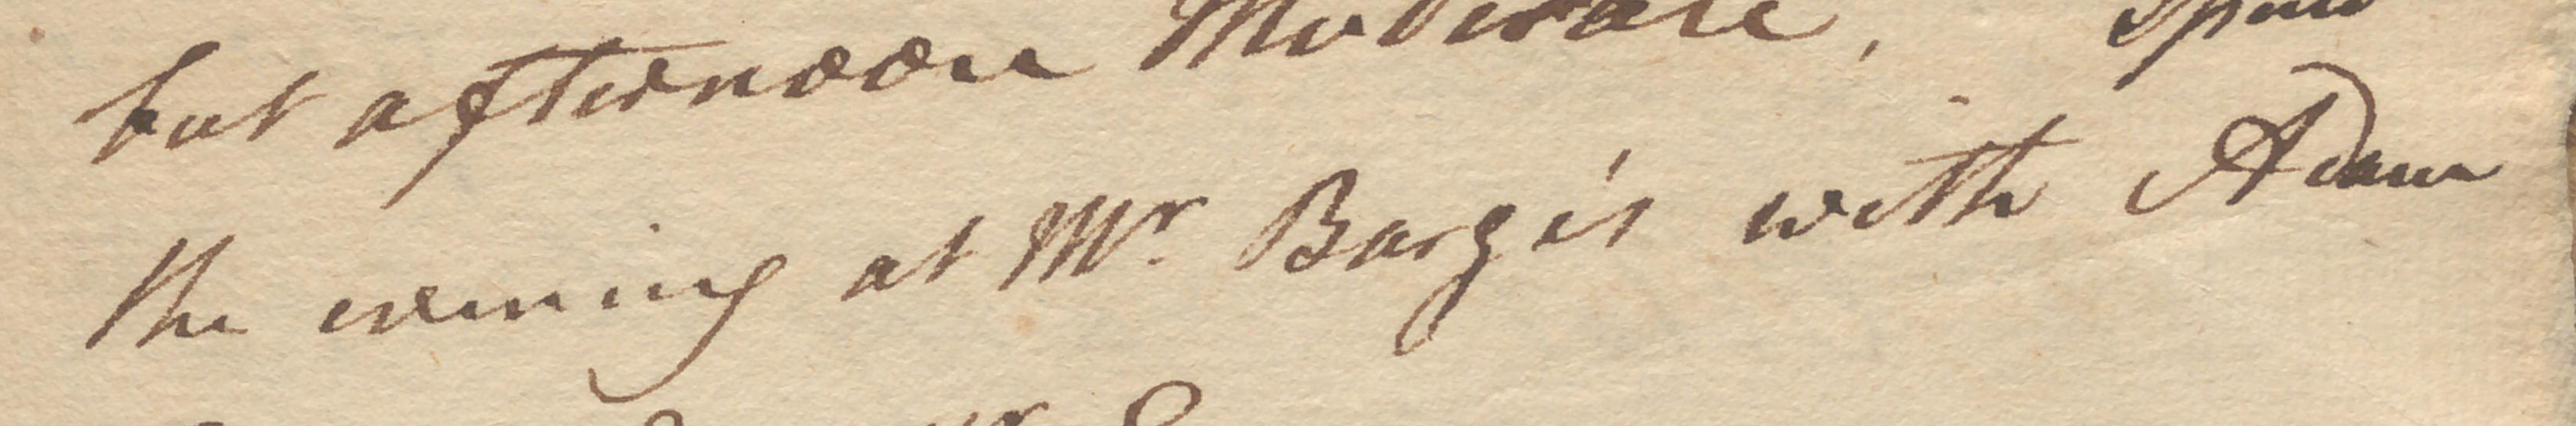the evening at M^r. Barges with Adam
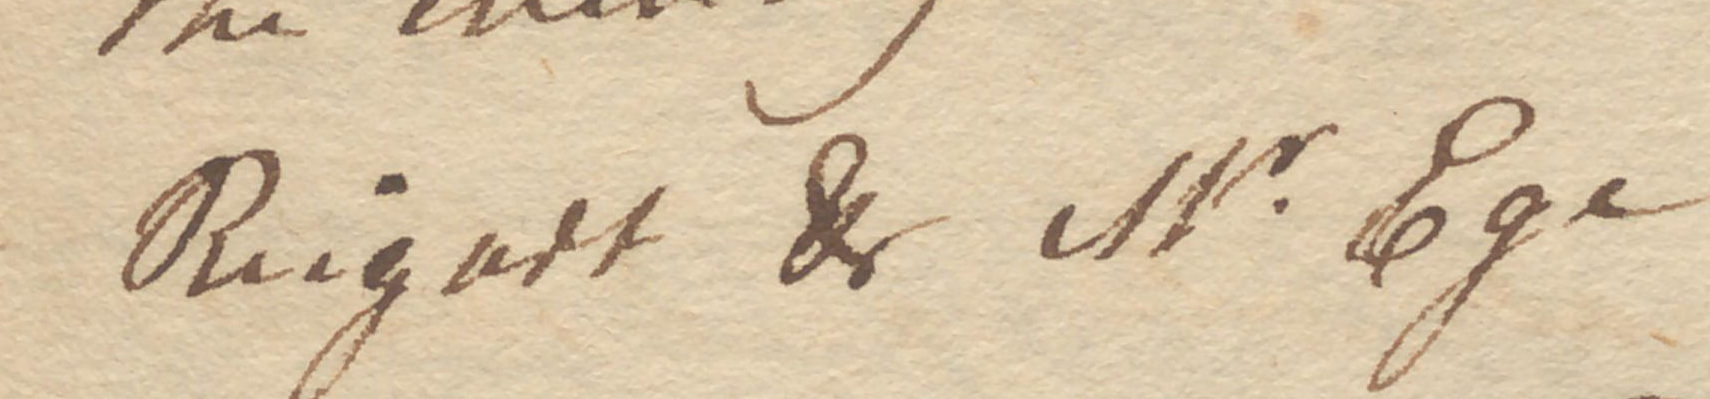Reigart & M^r. Ege
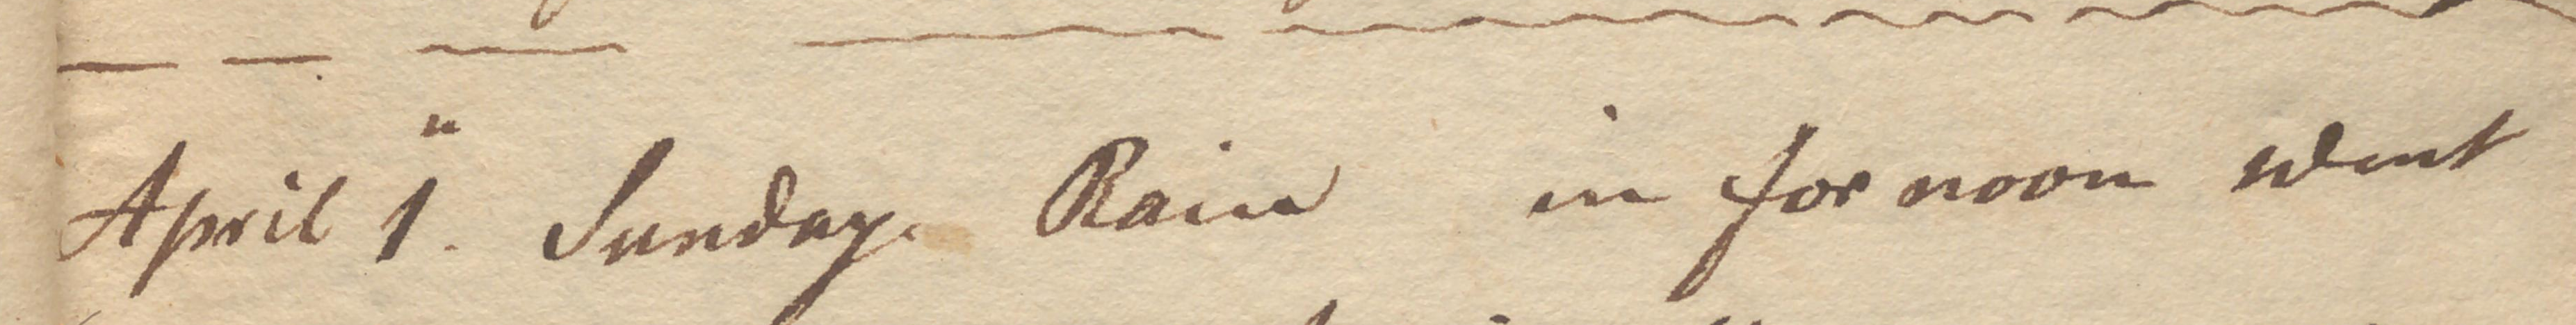April 1th. Sunday Rain in fornoon went
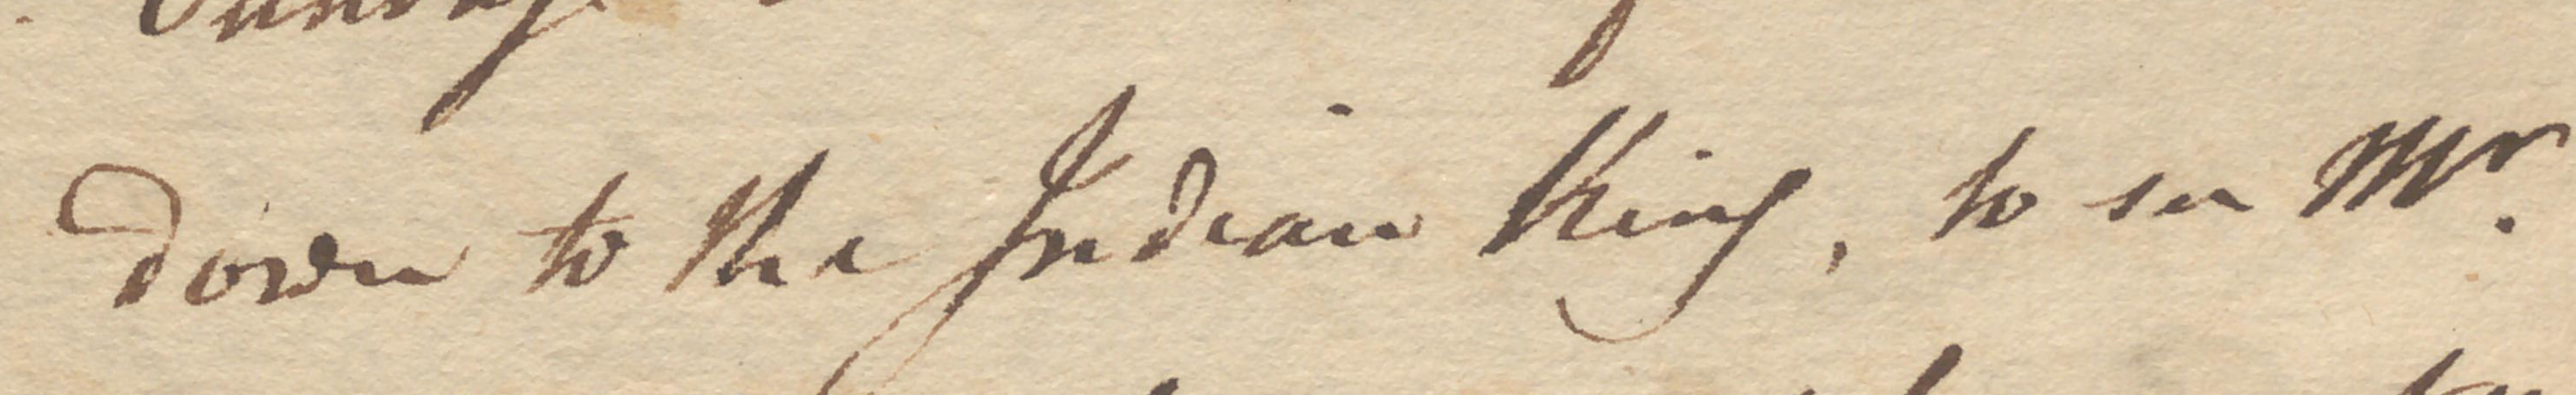down to the Indian King to see M^r.
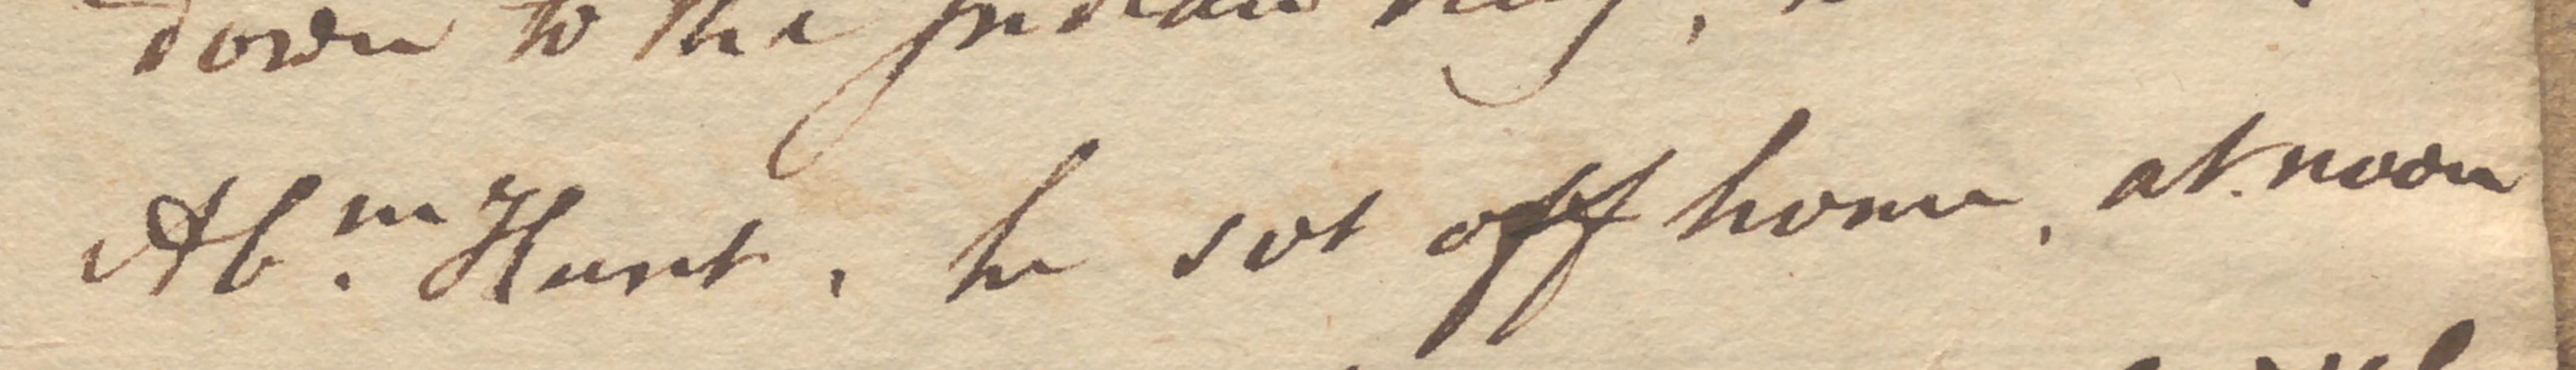Ab^m. Hunt, he set off home, at noon
